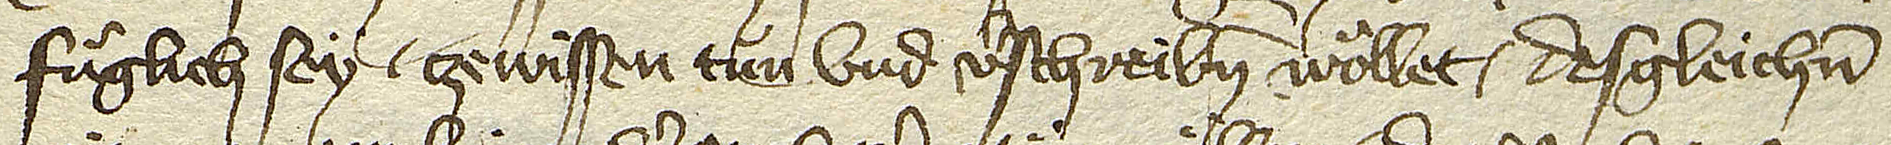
füglich ſey / cʒewiſſen tün vnd v*ſchreibn* wöllet / deſgleichn*
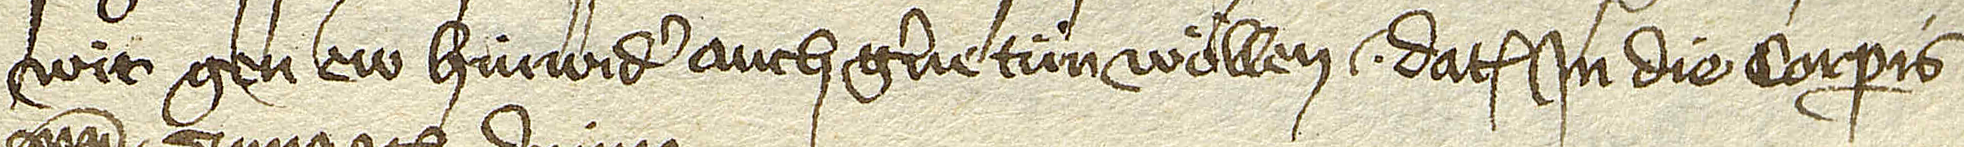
wir gen ew hinwid* auch g*ne tün wöllen / . dat* In die Corp*is
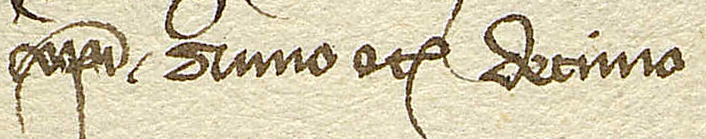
xpi* / Anno ec* decimo
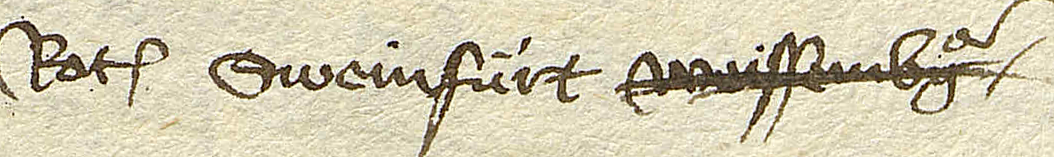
Rot* Sweinfürt weiſſembg* /
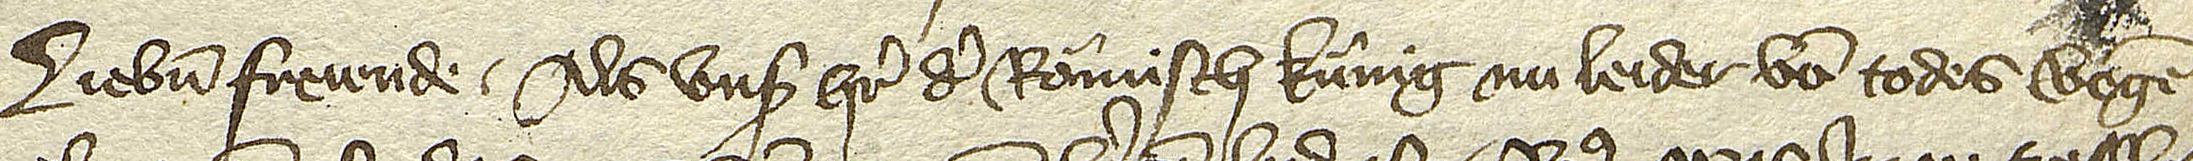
Liebn* frewnde / Als vnſ* hr* d* Römiſch künig nu leider vo* todes wege*
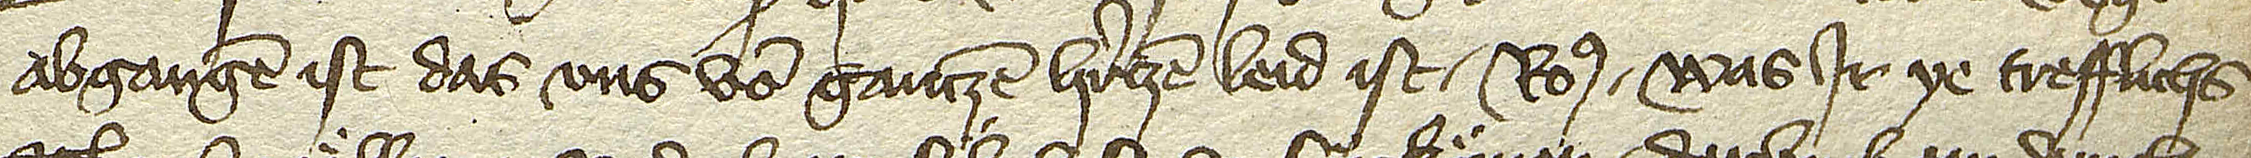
abgange* iſt das vns vo* gancʒe* hr*cʒe* leid iſt / Ro* / was Ir ye trefflichs
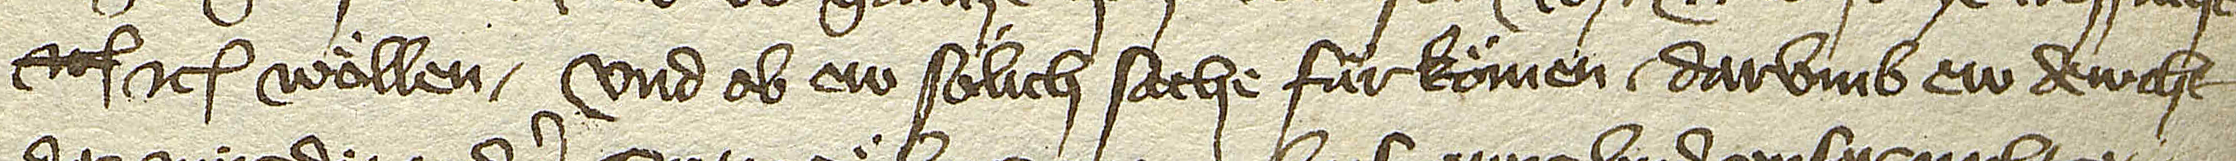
ec* ec* wöllen / vnd ob ew ſölich ſache für kömen / darvmb ew dewcht
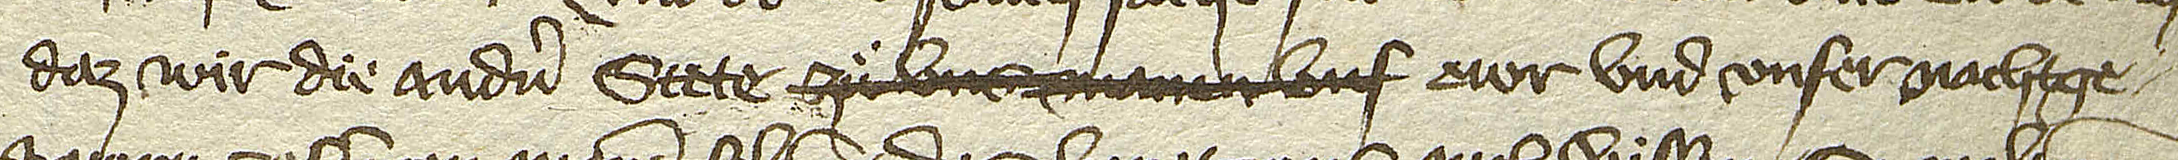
daʒ wir die andn* Stete cʒü vns manen vnſ ewr vnd vnſer nachtge /
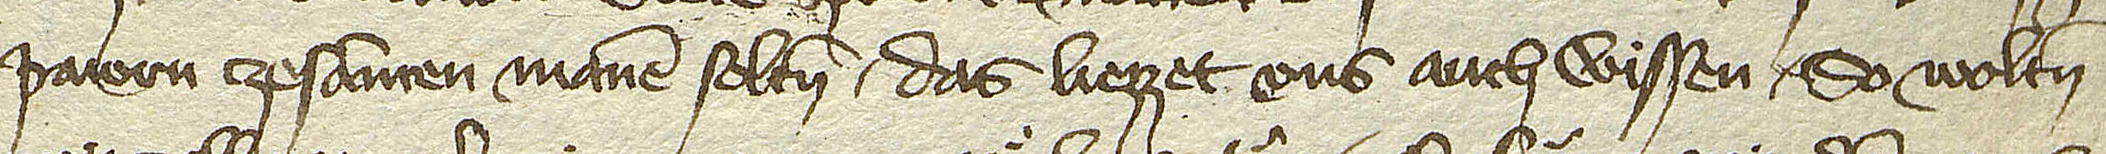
pawrn cʒeſa*men mane* ſoltn* / das lieʒʒet vns auch wiſſen / So woltn*
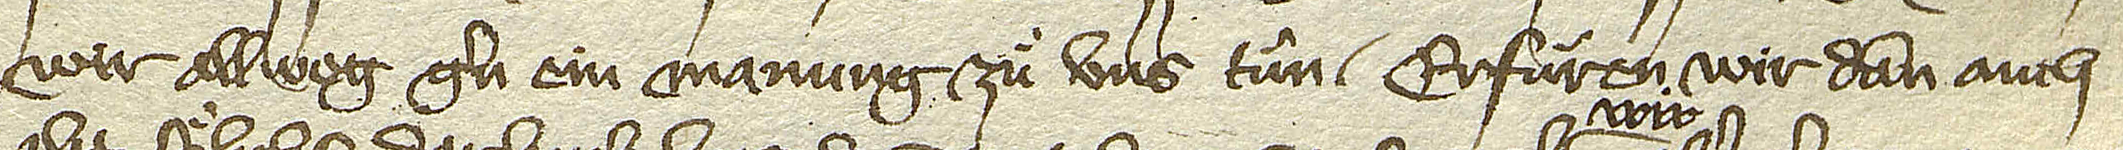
wir allweg g*n ein manung cʒü vns tün / Erfüren wir dan* auch
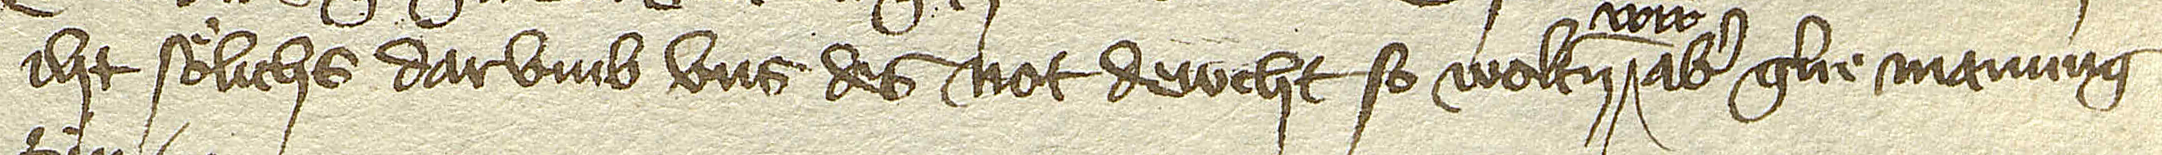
iht ſölichs darvmb vns des not dewcht ſo woltn* ab* g*ne manung
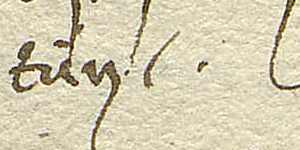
tün / .
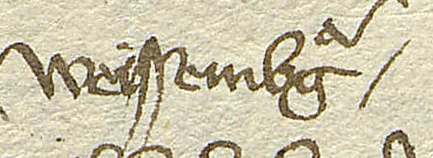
weiſſembg* /
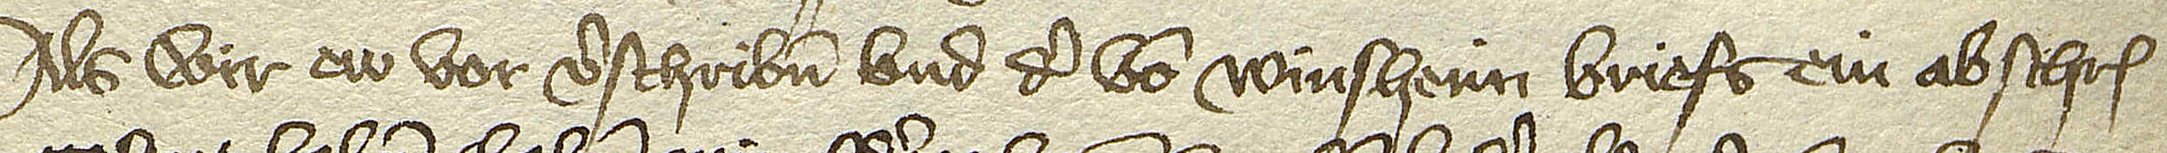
Als wir ew vor v*ſchribn* vnd d* vo* winſheim briefs ein abſchr*
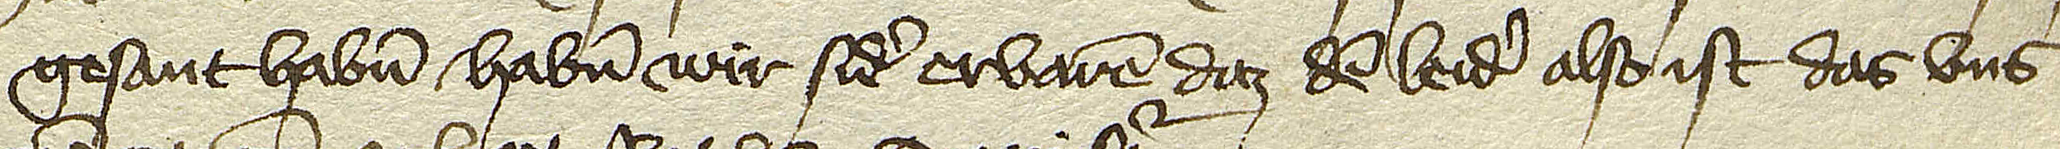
geſant habn* / habn* wir ſid* ervare* daʒ d* leid* alſo iſt das vns
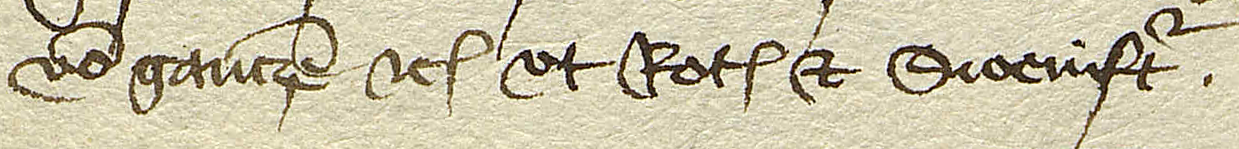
vo* gancʒe* ec* vt Rot* et Sweinft* .
